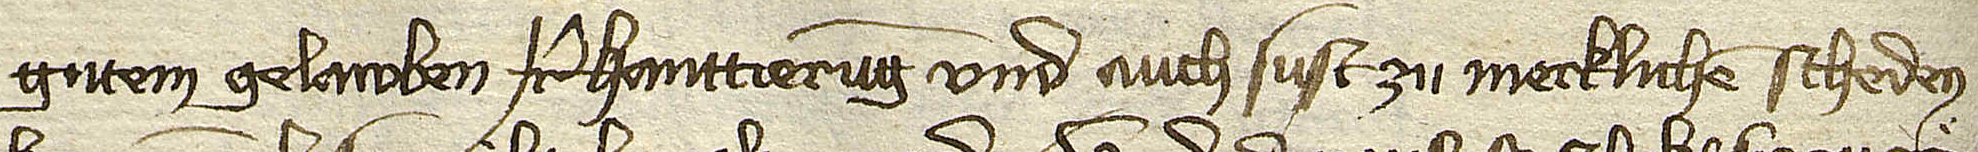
gutem gelawben Ir* Hanttieru*g vnd auch ſuſt ʒu merkliche* ſcheden
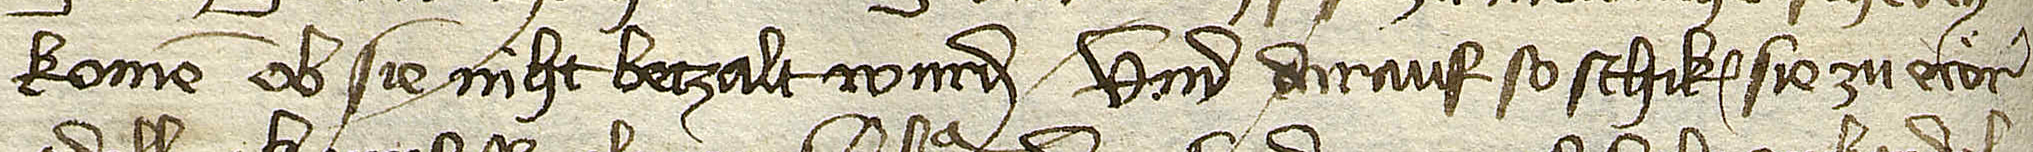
kome* ob ſie niht becʒalt wurd* / Vnd darauf ſo ſchik* ſie ʒu eẅr*
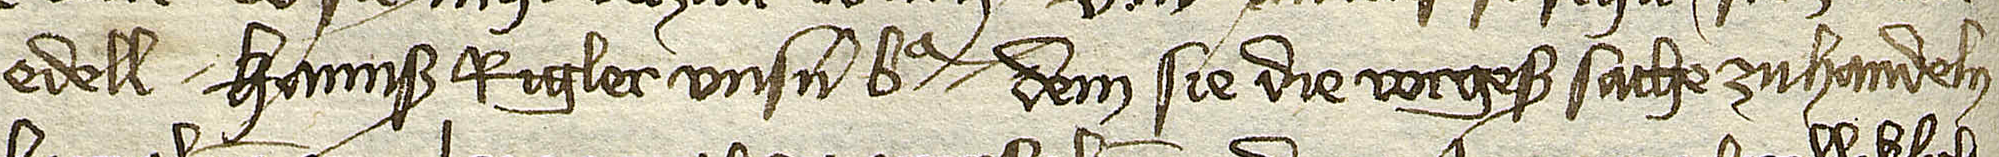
edell / Hannſ* Rigler vnſ*n b* / Dem ſie die vorgeſ* ſache ʒu handeln
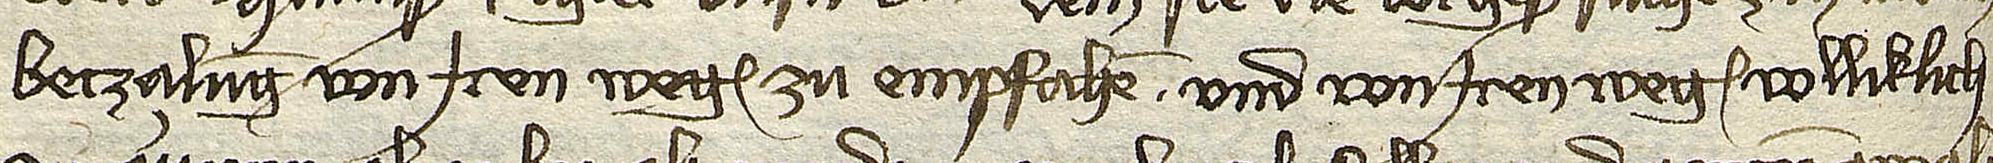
becʒalu*g von Iren weg* ʒu empfahe* . vnd von* Iren weg* volliklich
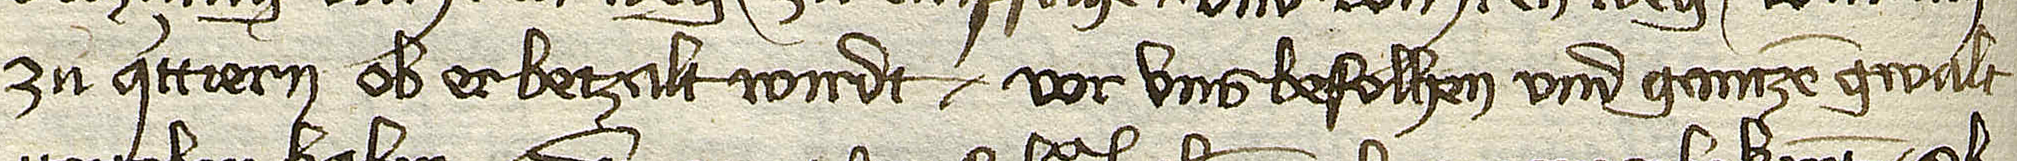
ʒu q*ttiern ob er becʒalt wurdt / vor Vns befolhen vnd gancʒe* gwalt
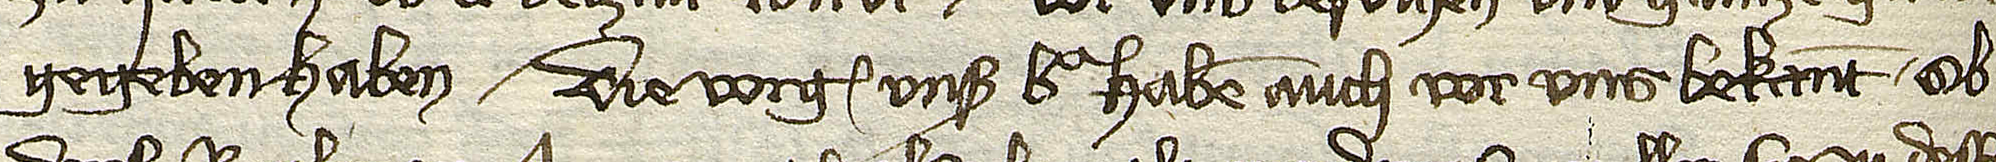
gegeben haben / Die vorg* vnſ* b* habe* auch vor vns bekant* / Ob
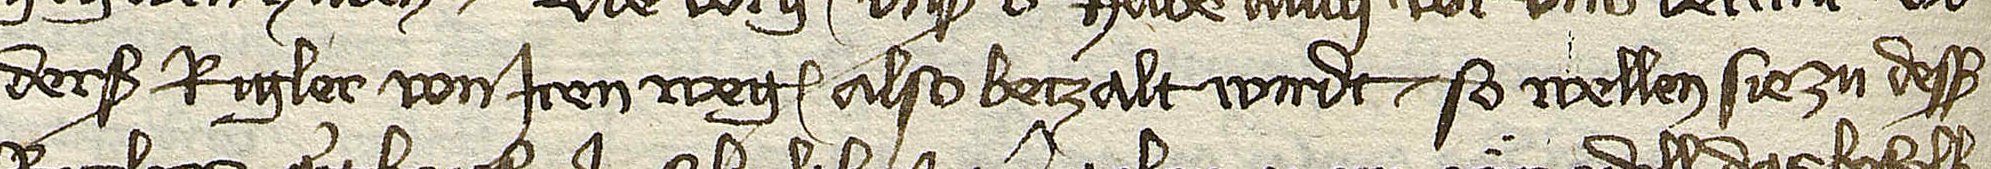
derſ* Rigler von Iren weg* alſo becʒalt wirdt / ſo wellen ſie ʒu deſſ*
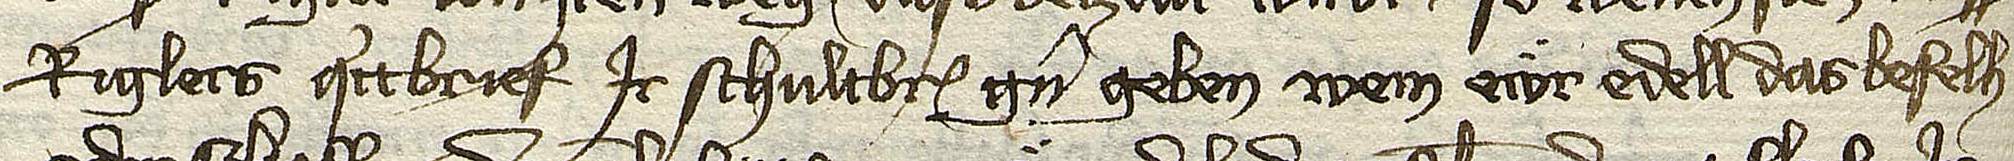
Riglers q*ttbrief Ir ſchultbr* g*n geben wem eẅr edell das befelh
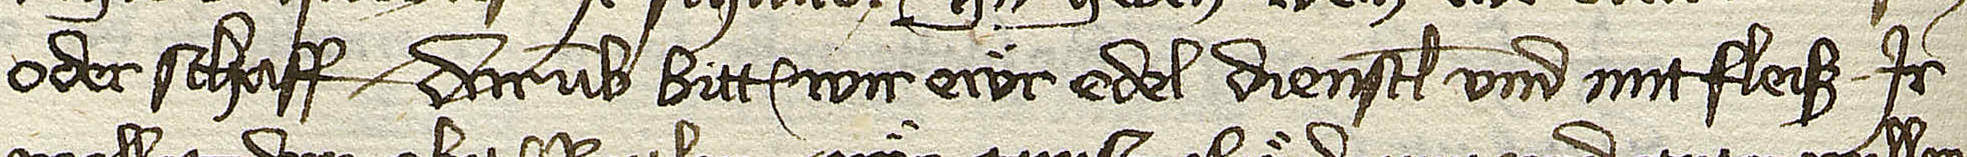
oder ſchaff / Darub* bitt* wir eẅr edel dienſtl* vnd mit fleiſʒ . Ir
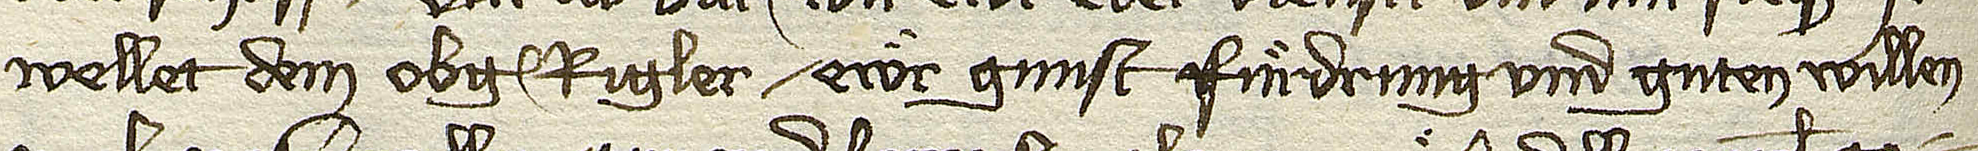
wellet dem obg* Rigler / eẅr gunſt fürdrung vnd guten willen
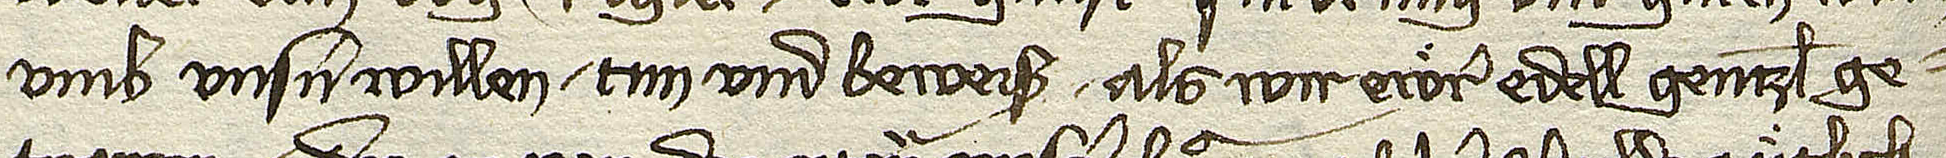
vmb vnſ*n willen / tun vnd beweiſ* / als wir eẅr* edell gencʒl* ge =
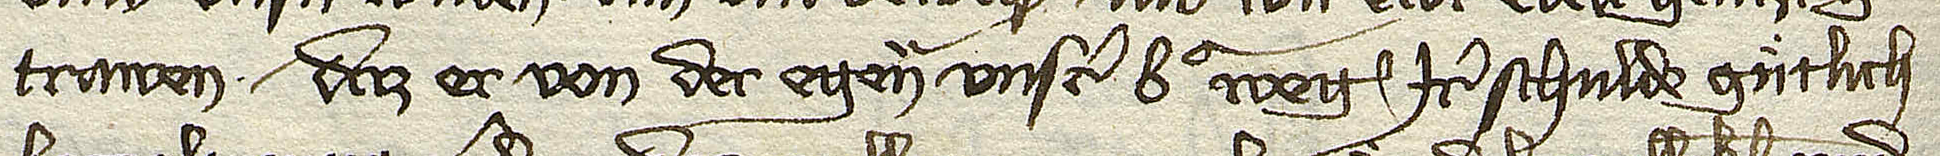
trawen . / Daʒ er von der egen* vnſ*r b* weg* Ir* ſchulde gütlich
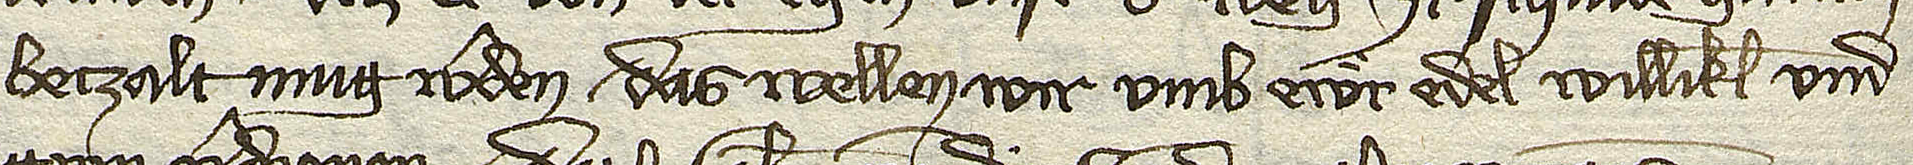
becʒalt mug w*den / Das wellen wir vmb eẅr edel willikl* vnd
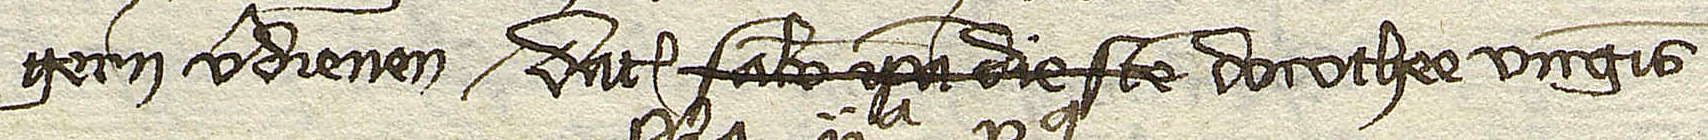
gern v*dienen / Dat* ſabo* ipa* die dorothee virgi*s
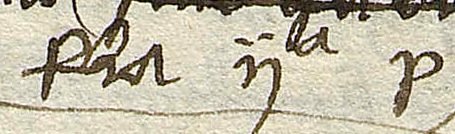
f*ia ii* p*
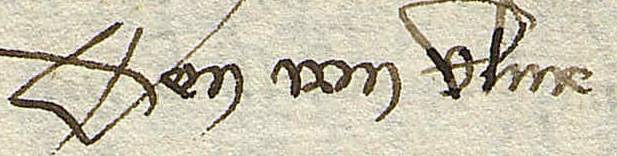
Den von Ulme
